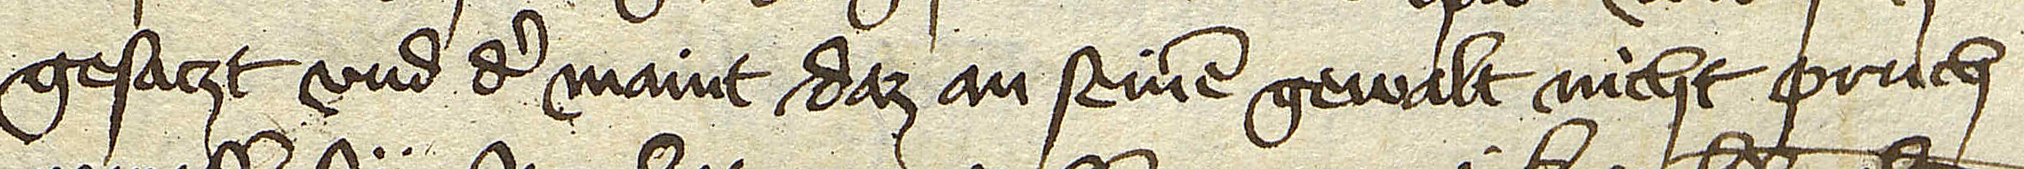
geſacʒt vnd d* maint / daʒ an ſeine* gewalt nicht pruch
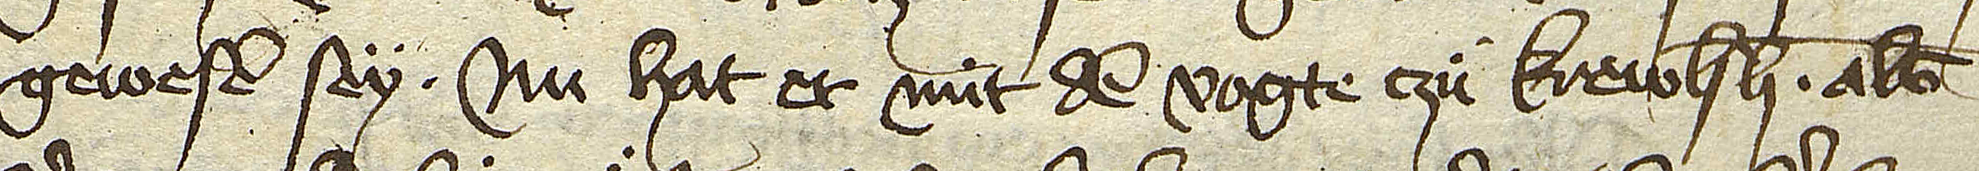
geweſe* ſey . Nu hat er mit d* vogte cʒü krewlſh* . als
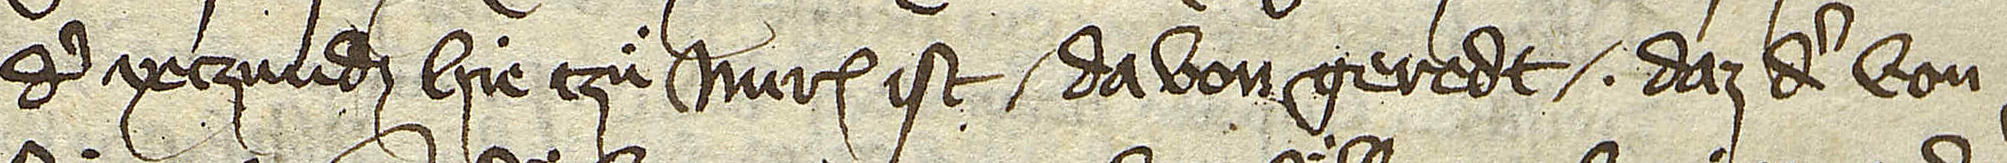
d* yecʒund* hie cʒü Nur* iſt / davon geredt / . daʒ d* von
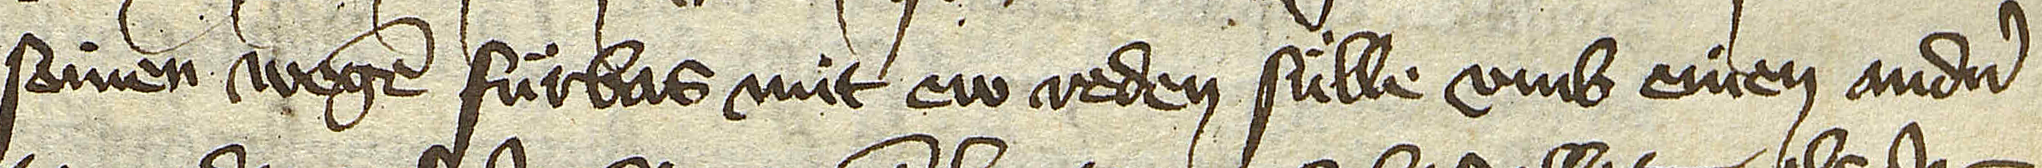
ſeinen wege* fürbas mit ew reden ſülle vmb einen andn*
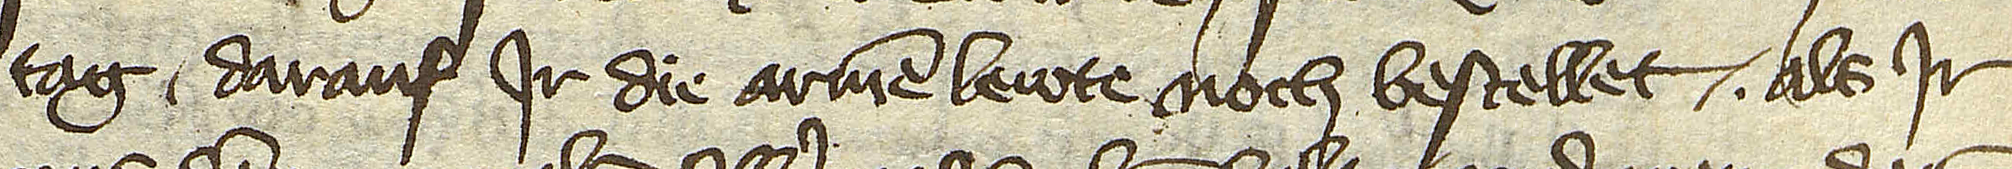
tag / darauf Ir die arme* lewte noch beſtellet / . als Ir
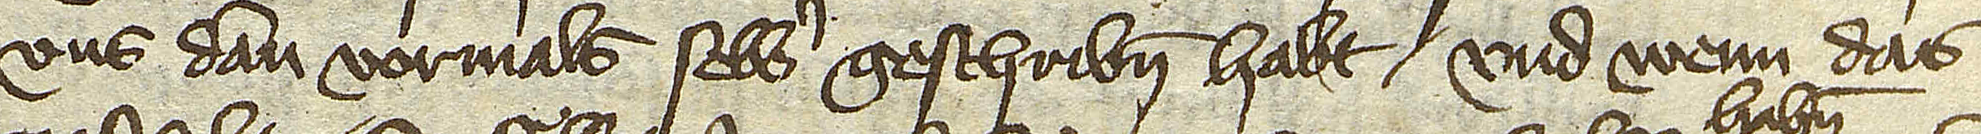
vns dan* vormals ſelb* geſchribn* habt / vnd wenn das
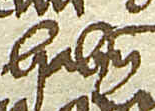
habn*
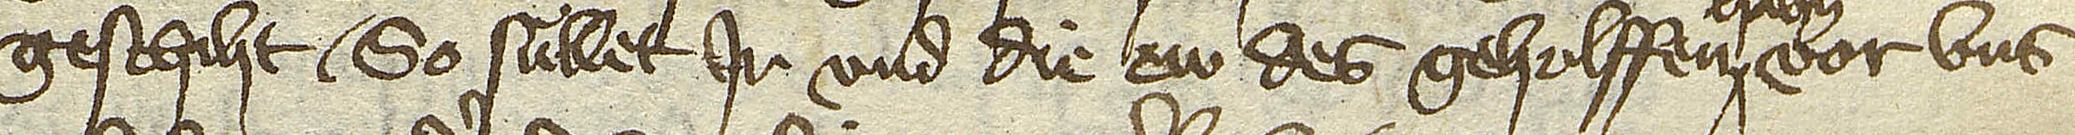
geſchiht / So ſüllet Ir vnd die ew des geholffen vor vns
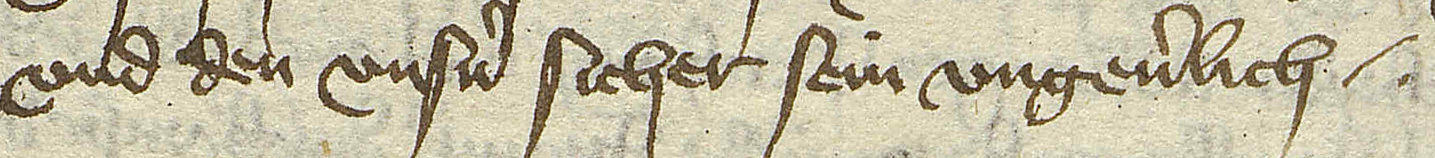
vnd den vnſn* ſicher ſein vngeu*lich / .
